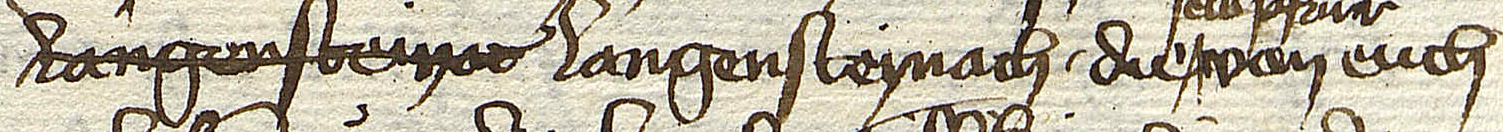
langenſteinac langenſteynach / die von euch
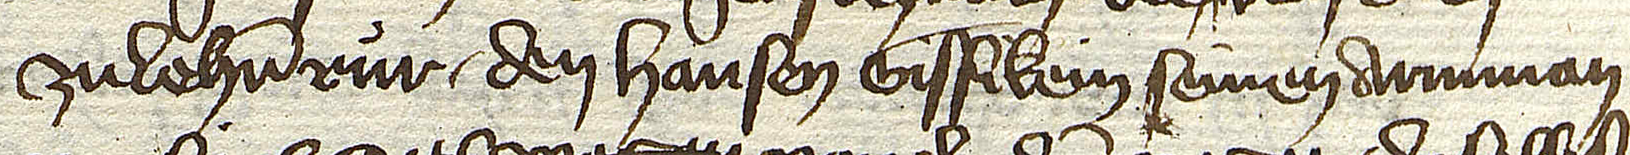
cʒuleh*n rür / den hanſen Giſſikein ſeinen Armman
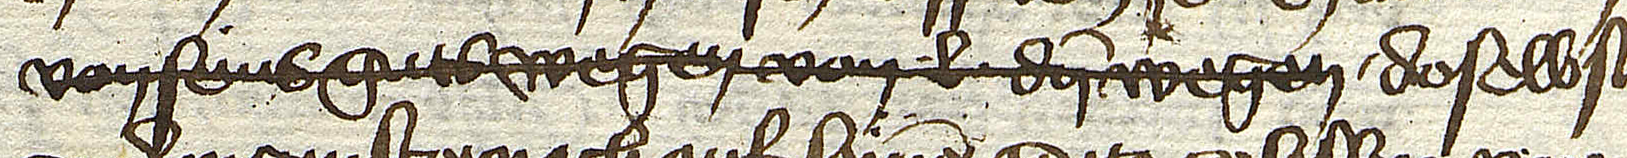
von ſeins guts wegen von . l . dn* wegen / doſelbſt
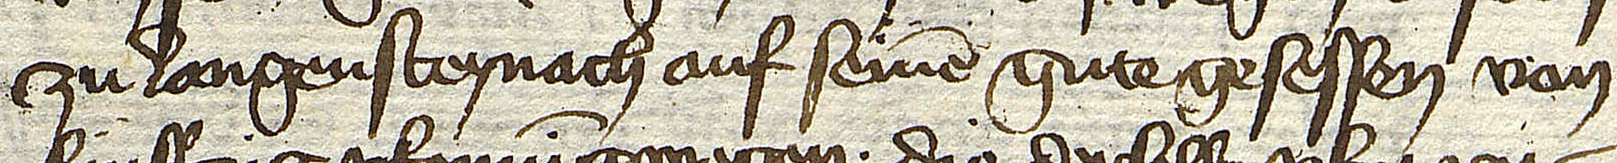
ʒu langenſteynach auf ſeine* gute geſeſſen von
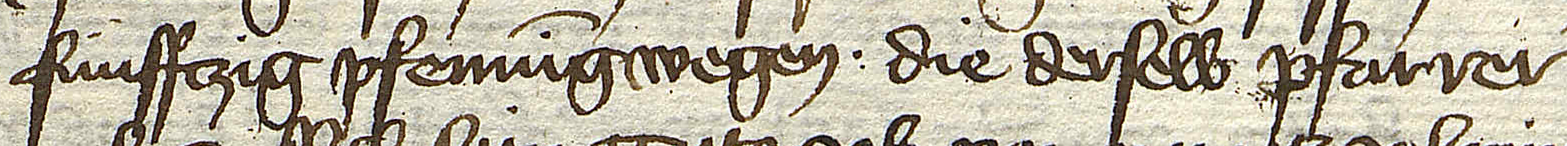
fünffcʒig pfenni*g wegen . die derſelb pfarrer
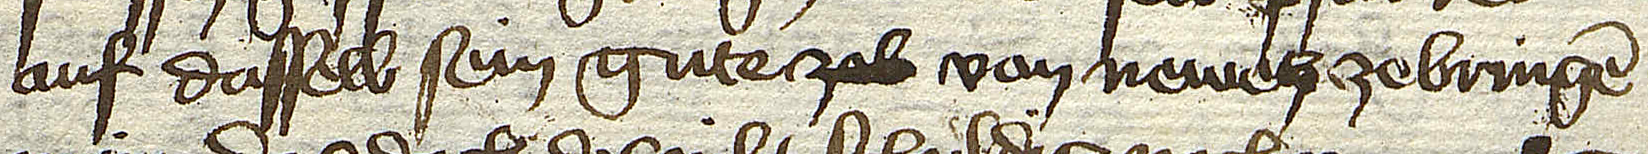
auf daſſelb ſein gute cʒeb von newen cʒebringe*
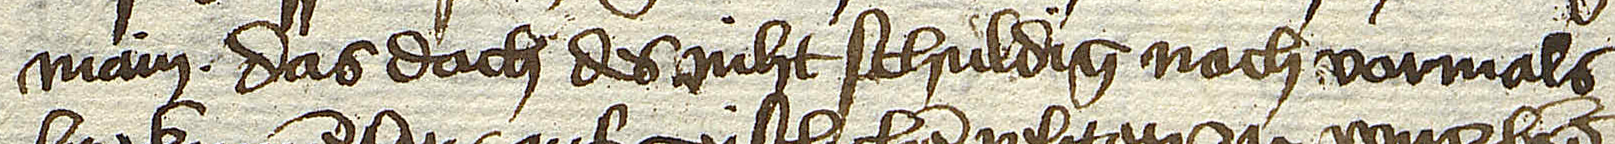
main . das doch des niht ſchuldig noch vormals
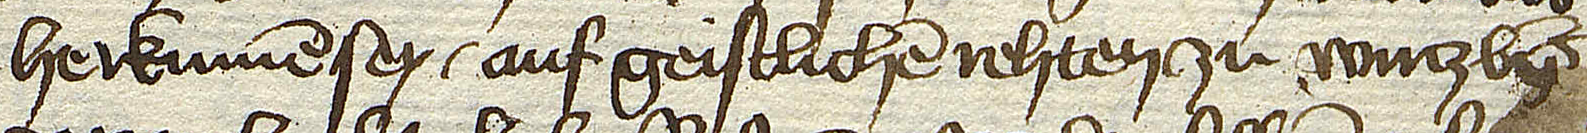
herkume* ſey / auf geiſtliche* rehten cʒu wircʒb*g
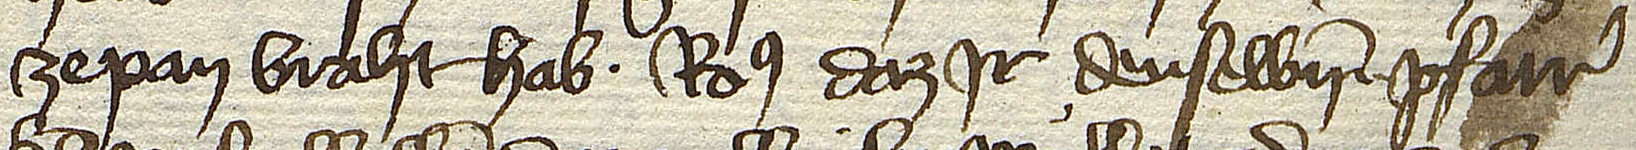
cʒepan braht hab . Ro* daʒ Ir denſelb*n pfarr*
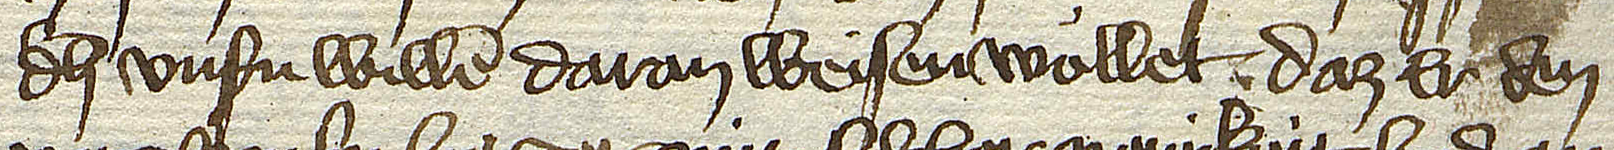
d*h* vnſ*n wille* daran weiſen wöllet . daʒ Er den
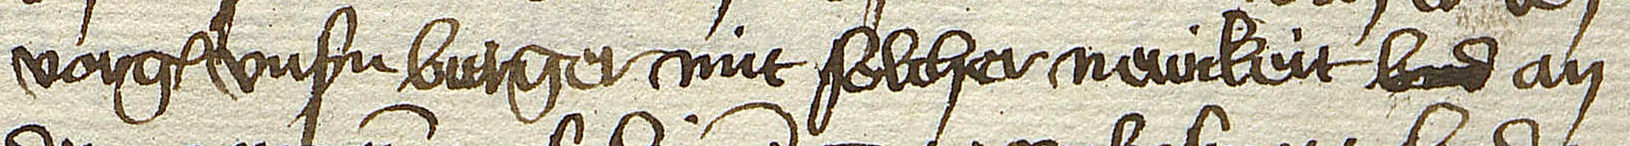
vorg* vnſ*n burger mit ſölicher newikeit vnd an
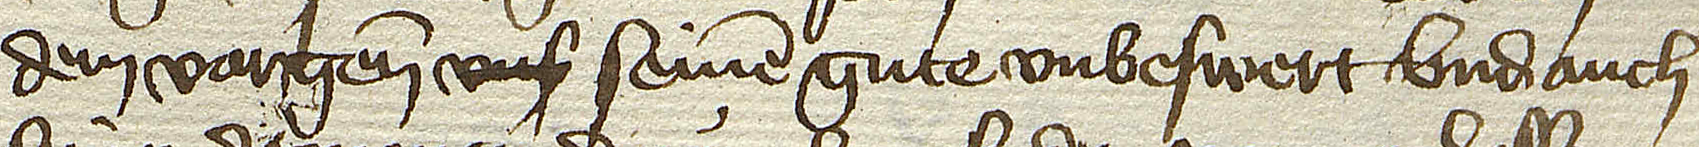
dem vorgen* vnſ* ſeine* gute vnbeſwert vnd auch
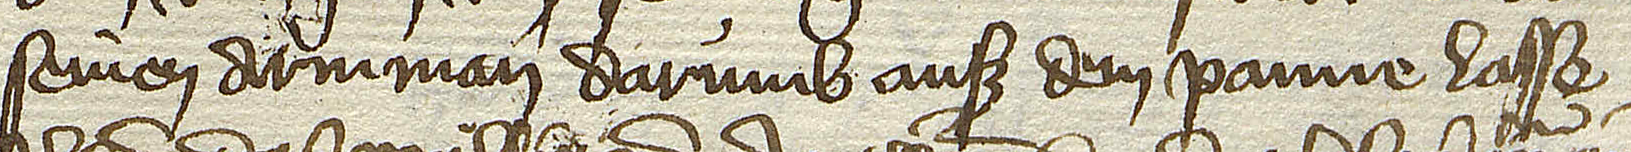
ſeinen Armman darümb auſʒ dem panne laſſe
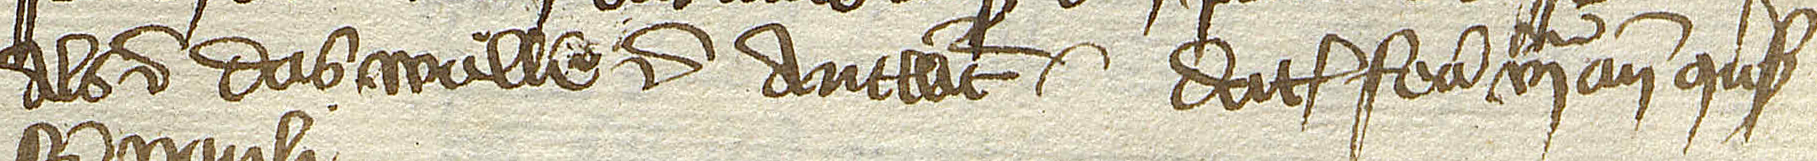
Als ec* das wölle* ec* Antw*t / dat* fea* vi* an* *u*ſ*
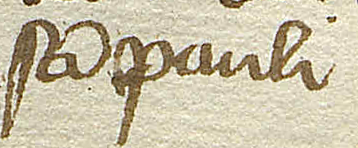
ſ*c*i pauli
